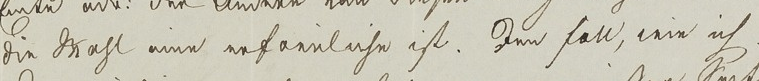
die Wahl eine erfreüliche ist. Im fall, wie ich
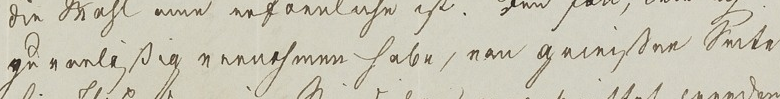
zuverläßig vernohmen habe, von gewisser Seite
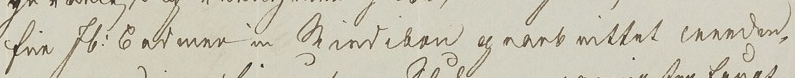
für Jb: Bodmer in Wiedikon gearbeittet werden,
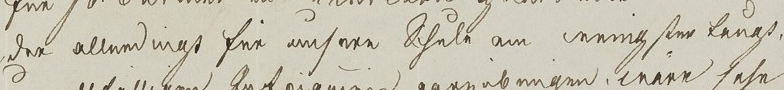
der allerdings für unsere Schule am wenigsten taugt,
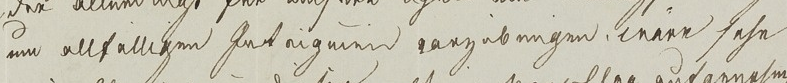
um allfälligen Intriguen vorzubeugen, wäre sehr
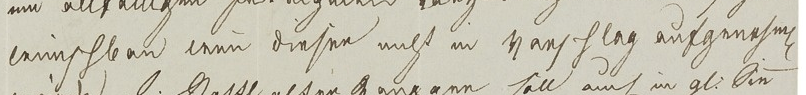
wünschbar wenn dieser nicht im Vorschlag aufgenohmen
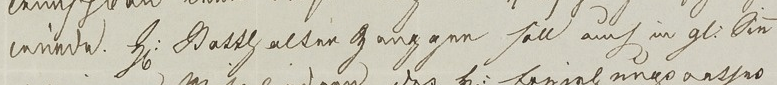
würde. H: Statthalter Zangger soll auch im gl: Sinn
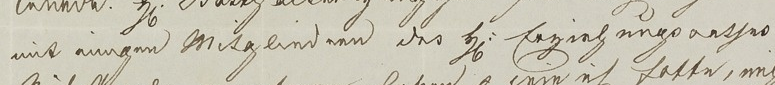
mit einigen Mitgliedern des H: Erziehungsrathes
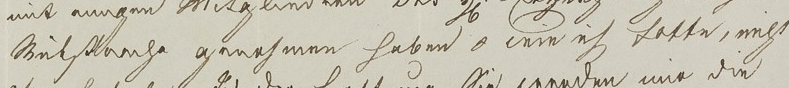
Rüksprache genohmen haben & wie ich hoffe, nicht
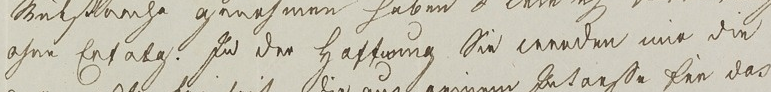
ohne Erfolg. In der Hoffnung Sie werden mir die
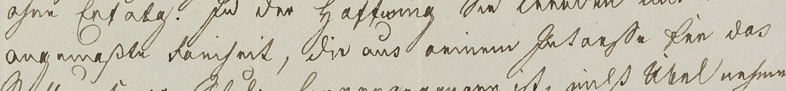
angemaßte Freiheit, die aus meinem Intresse für das
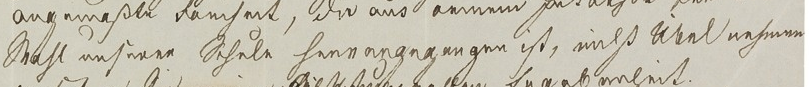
Wohl unserer Schule hervorgegangen ist, nicht Übel nehmen
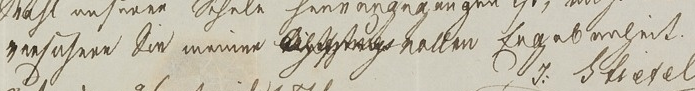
versichere Sie meiner ... vollen Ergebenheit.
